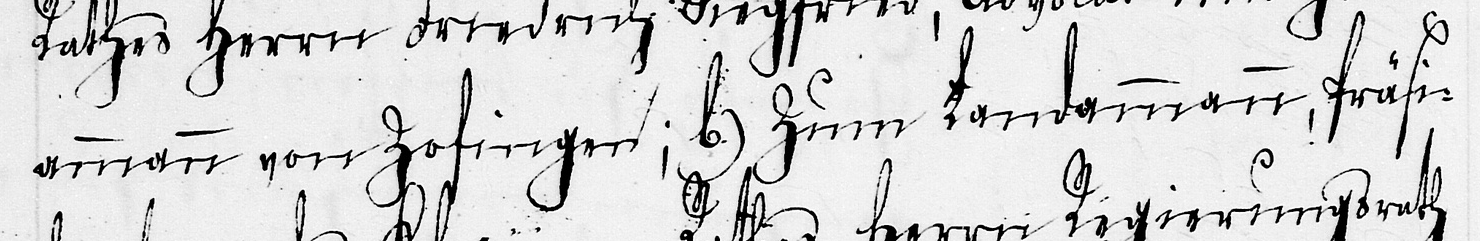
dammann von Zofingen; b.) Zum Landammann, Präsi¬
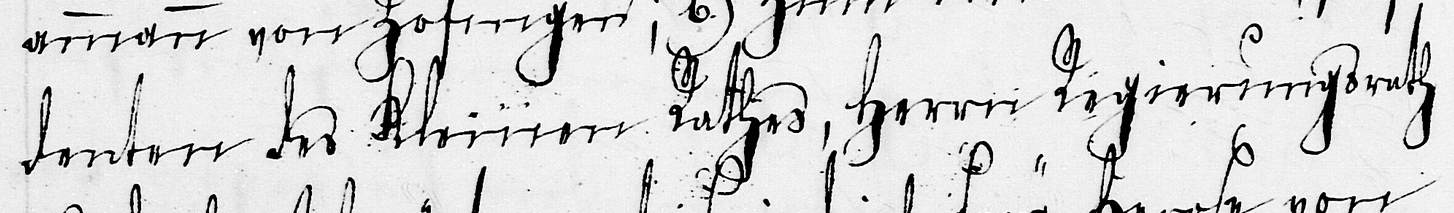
denten des Kleinen Rathes, Herrn Regierungsrath
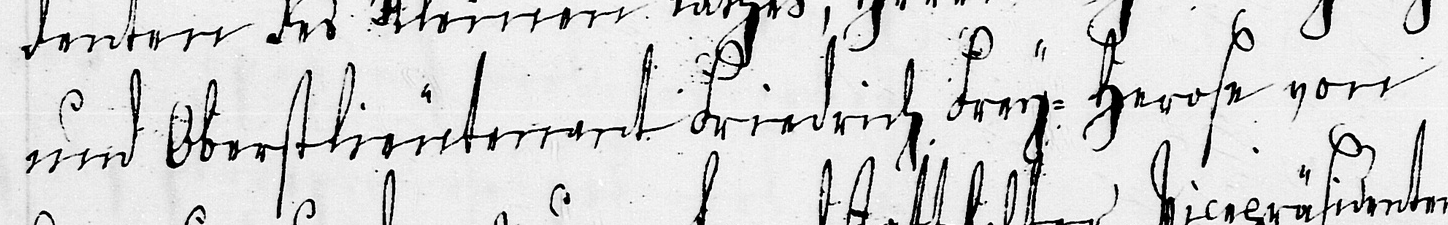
und Oberstlieutenant Friedrich Frey-Herose von
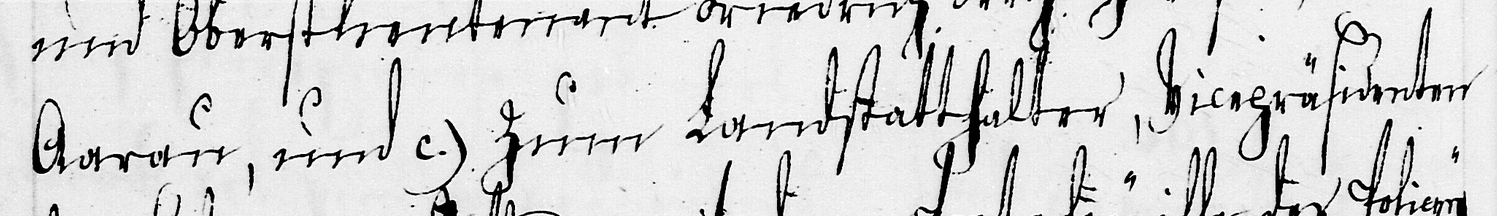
Aarau, und c.) Zum Landstatthalter, Vicepräsiden¬
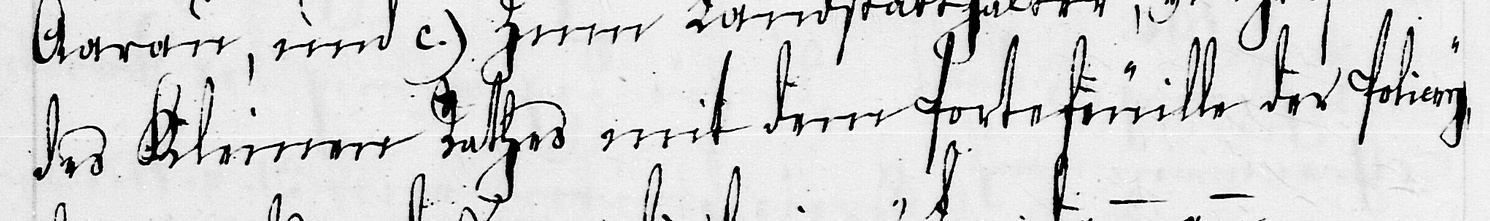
des Kleinen Rathes mit dem Portefeuille der Polic¬
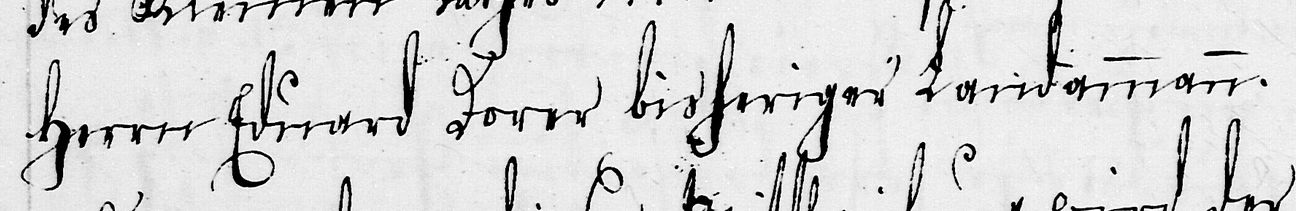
Herrn Eduard Dorer bisheriger Landammann.
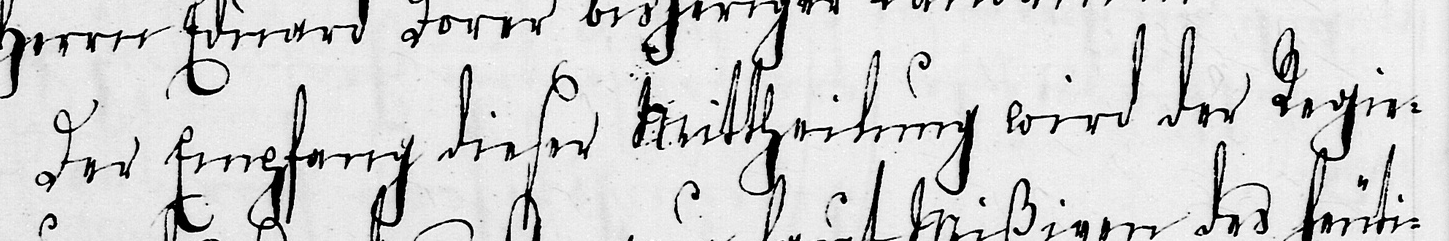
Der Empfang dieser Mittheilung wird der Regie¬
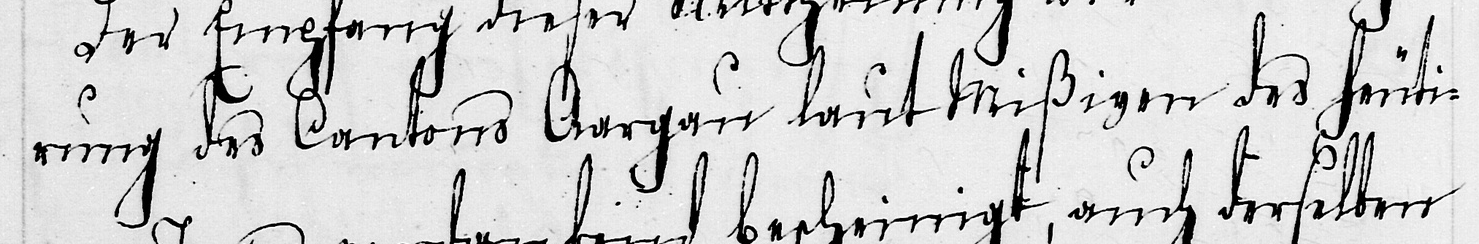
rung des Cantons Aargau laut Mißiven des heuti¬
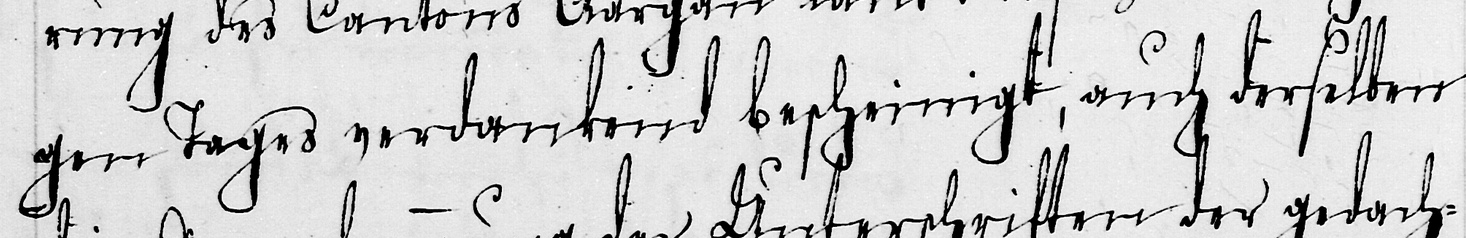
gen Tages verdankend bescheinigt, auch derselben
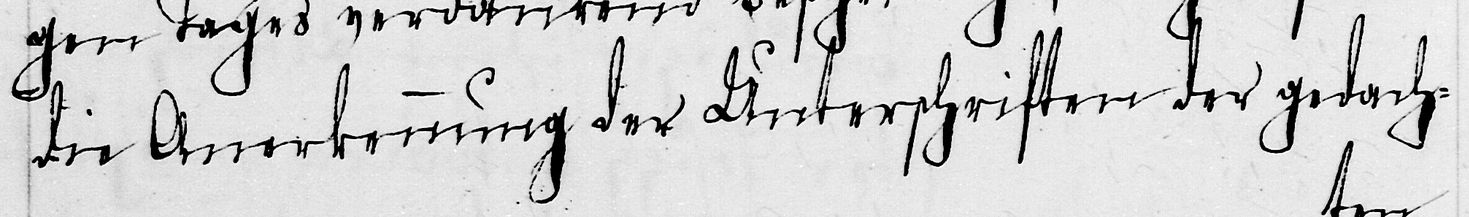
die Anerkennung der Unterschriften der gedach-
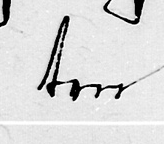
ten
